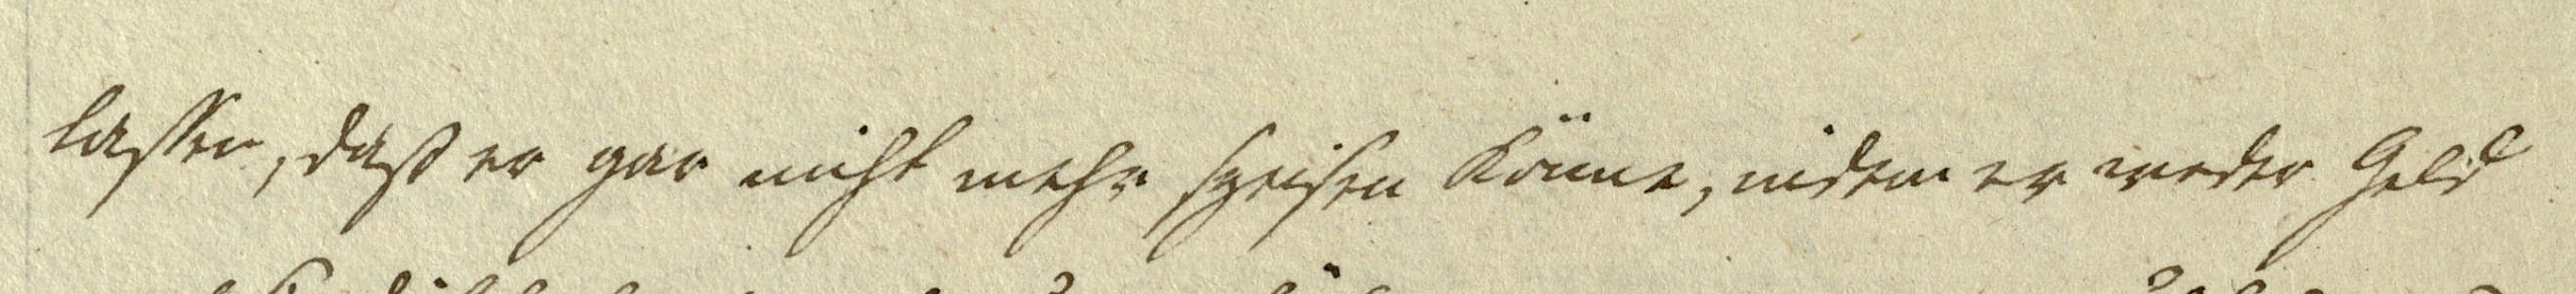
lassen, daß er gar nicht mehr speisen könne, indem er weder Geld
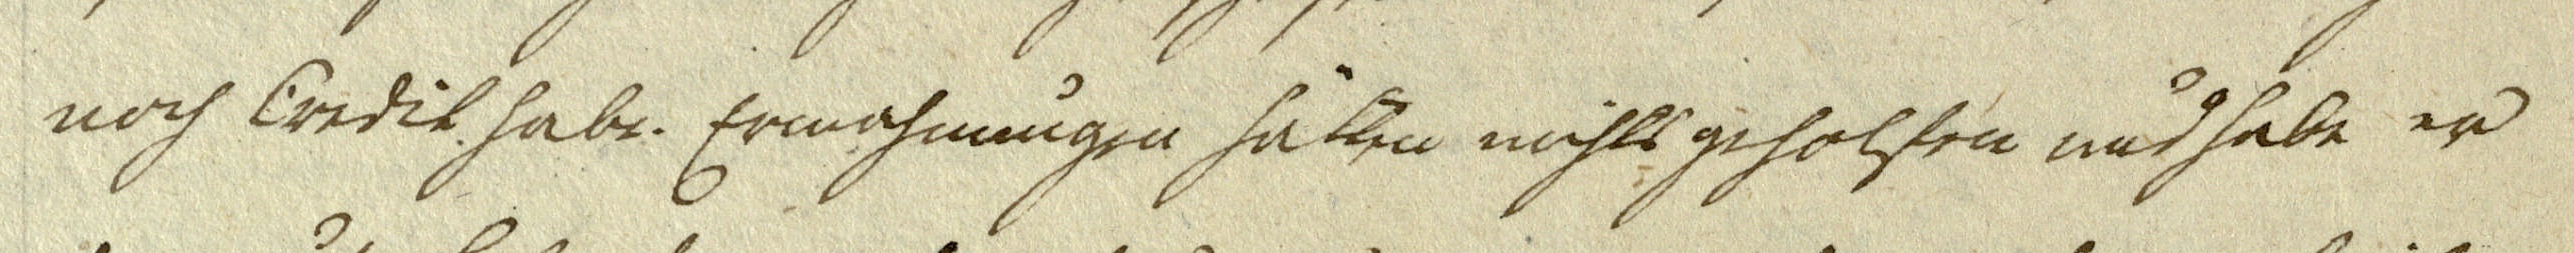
noch Credit habe. Ermahnungen hätten nicht geholfen und habe er
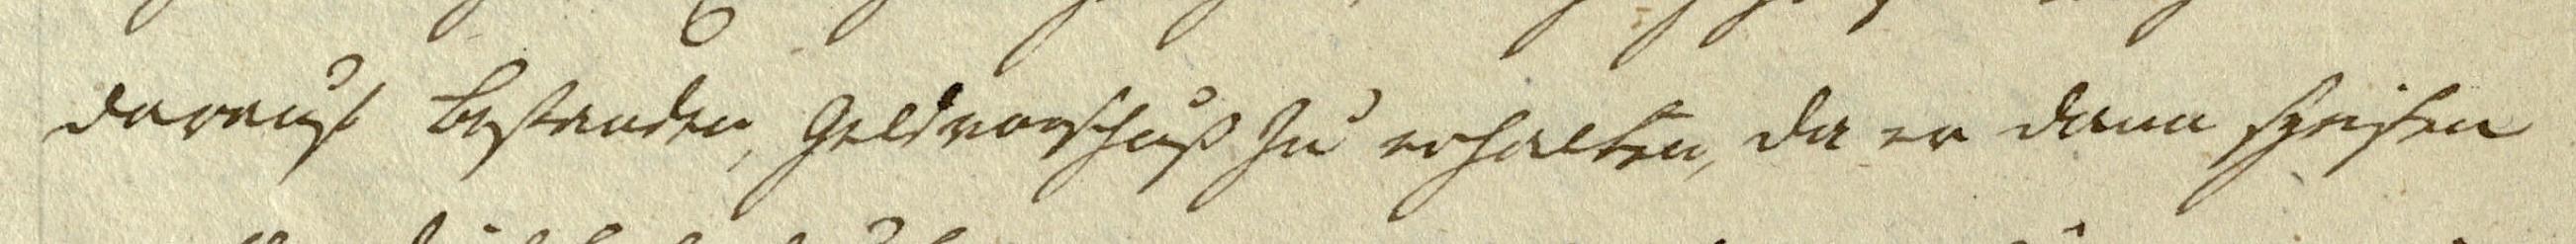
darauf bestanden, Geldvorschuß zu erhalten, da er dann speisen
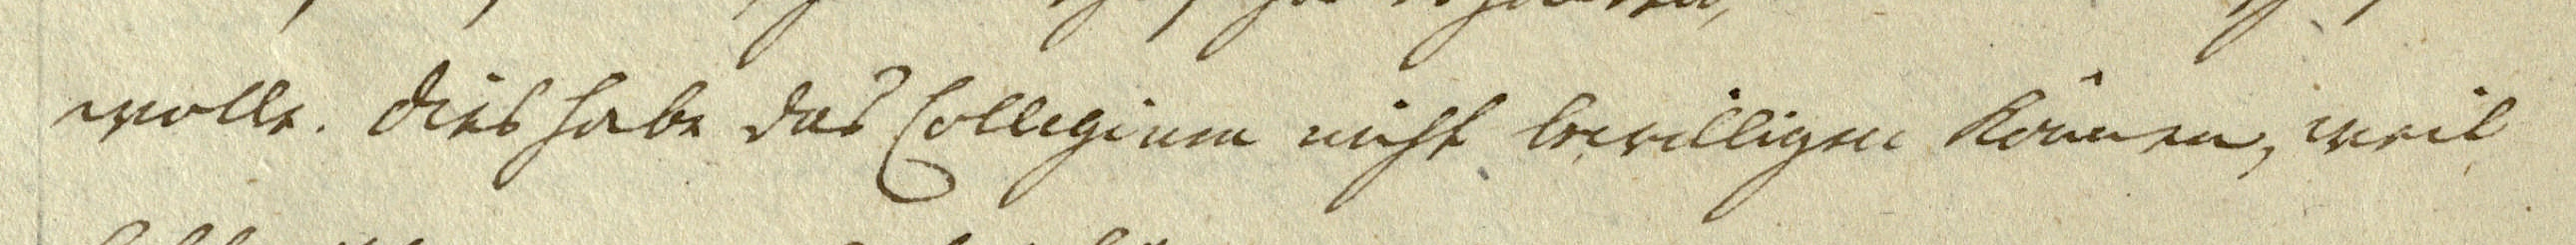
wolle. Dies habe das Collegium nicht bewilligen können, weil
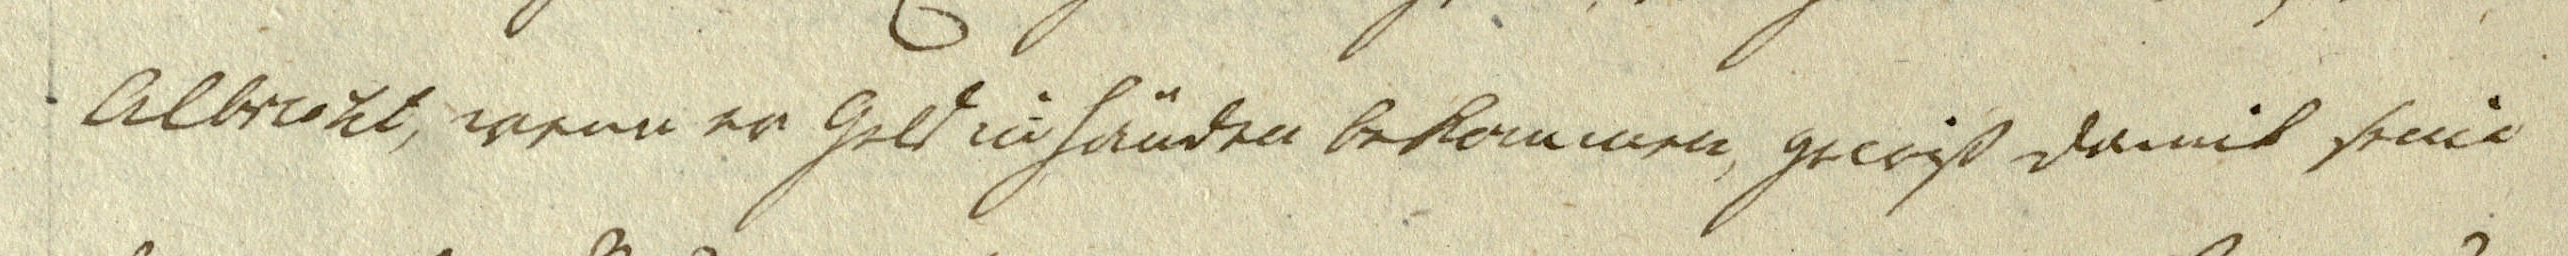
Albrecht, wenn er Geld in Händen bekommen, gewiß damit seine
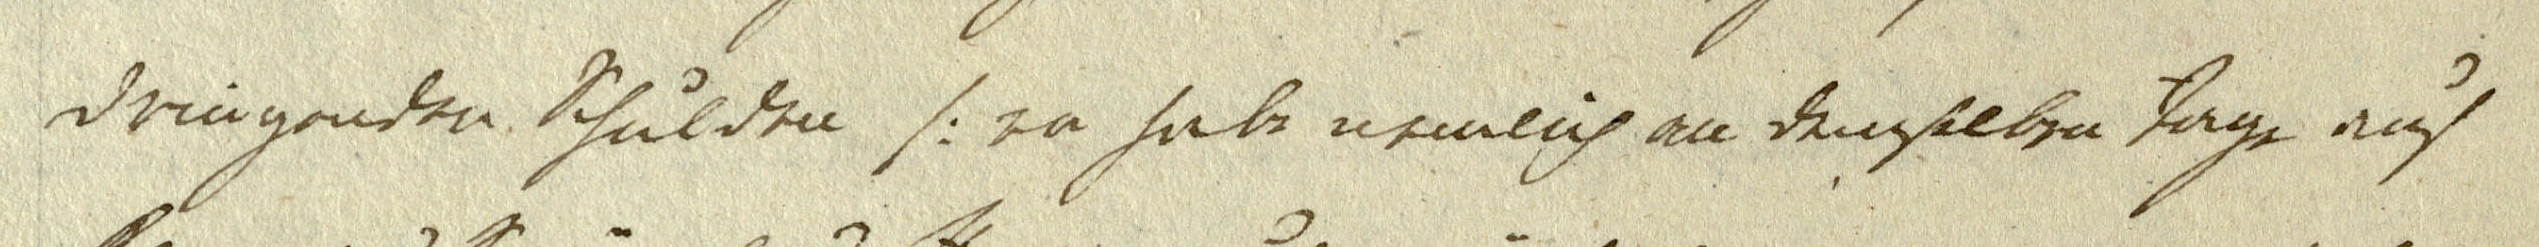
dringenden Schulden /: er habe nemlich an demselben Tage auf
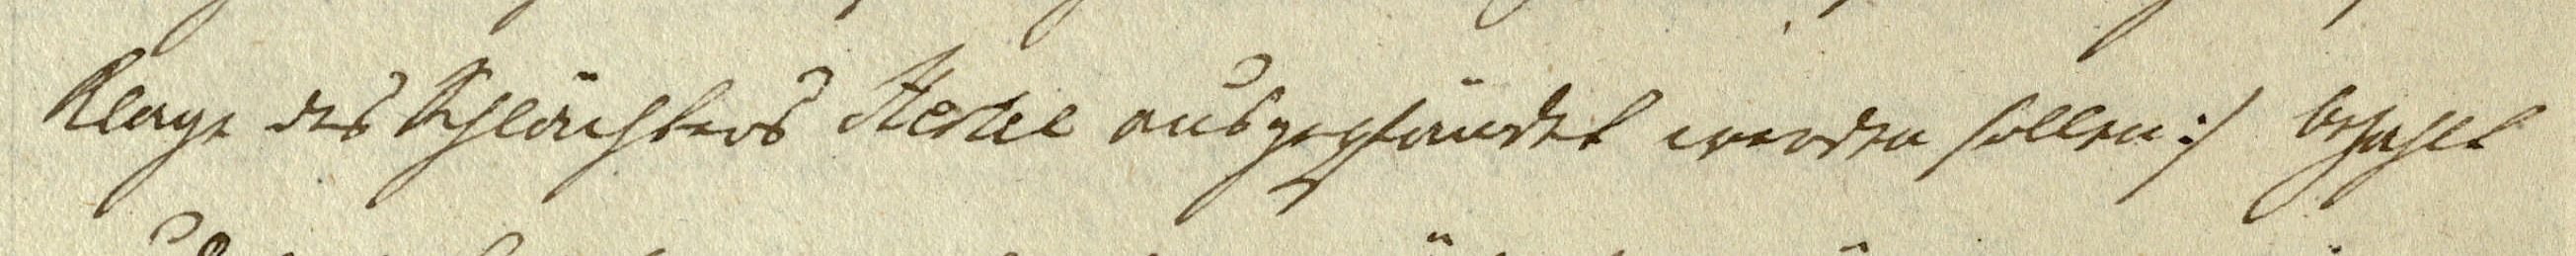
Klage des Schlächters Hertel ausgepfändet werden sollen :/ bezahlt
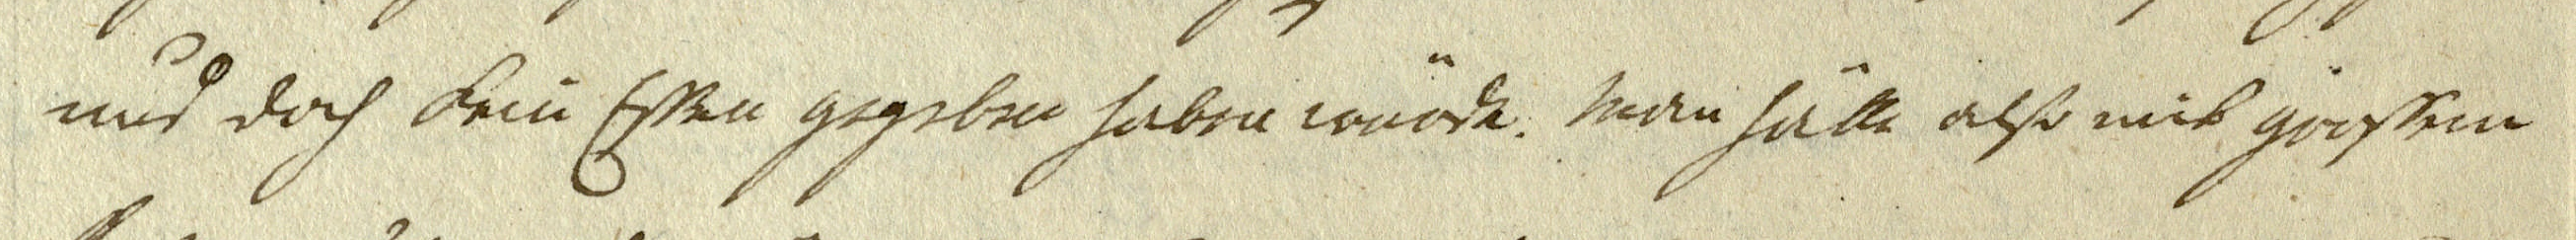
und doch kein Essen gegeben haben würde. Man hätte also mit grossem
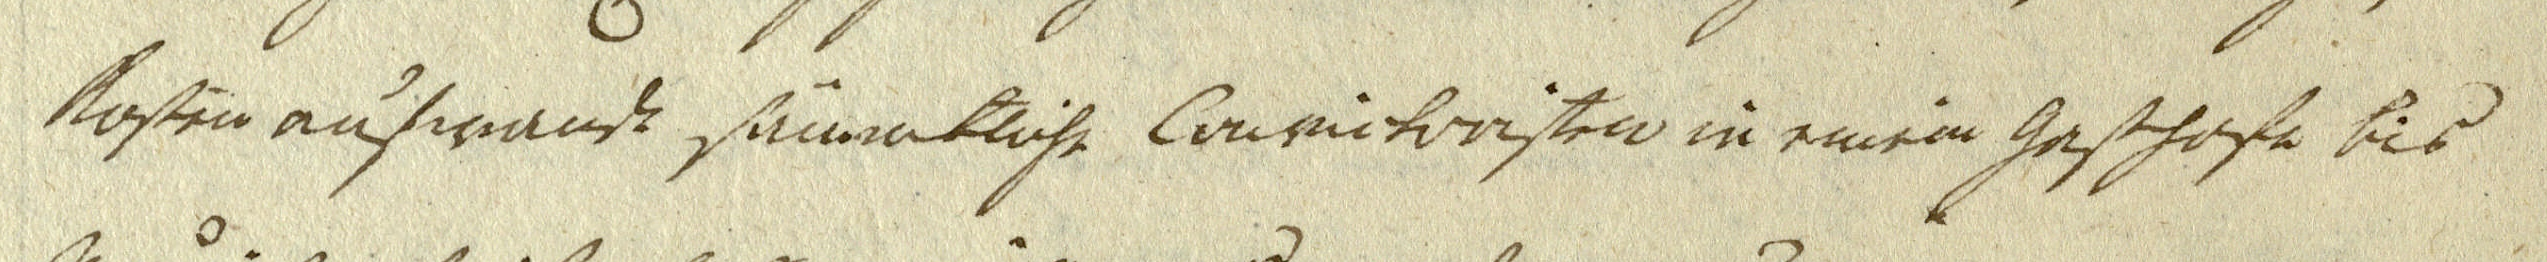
Kostenaufwandt sämmtliche Convictoristen in einem Gasthofe bis
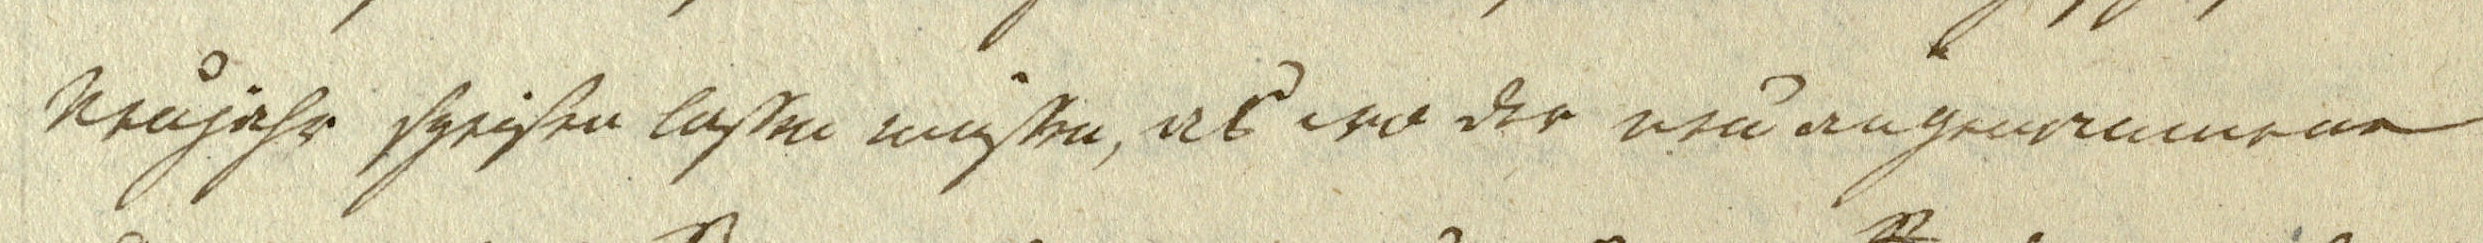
Neujahr speisen lassen müssen, als wo der neu angenommene
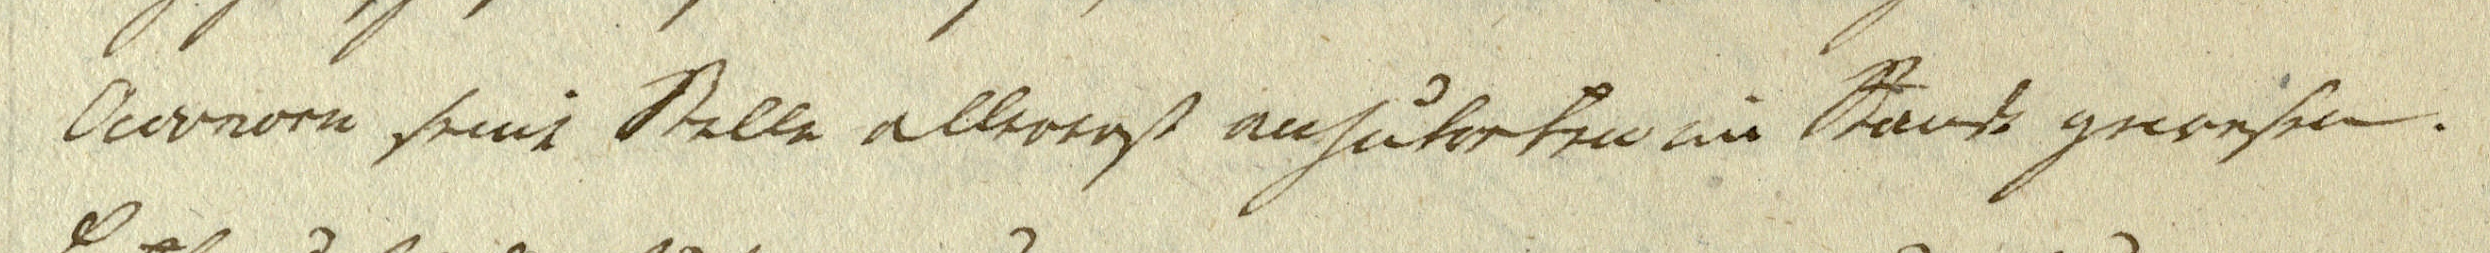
Oeconom seine Stelle allererst anzutreten im Stande gewesen.
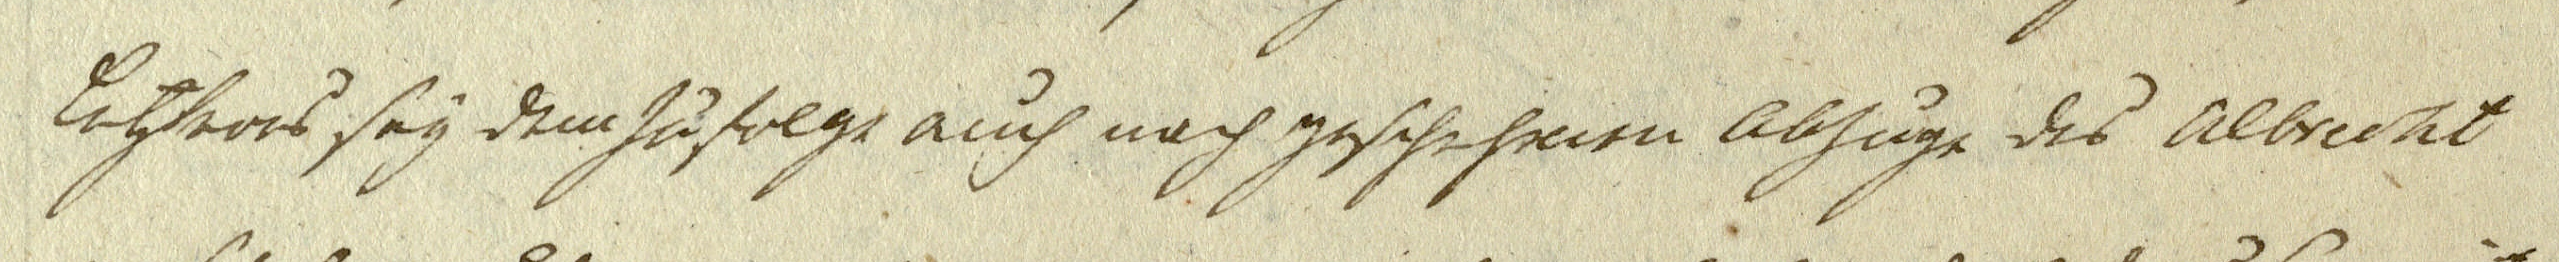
Letztens seÿ demzufolge auch nach geschehenen Abzuge des Albrecht
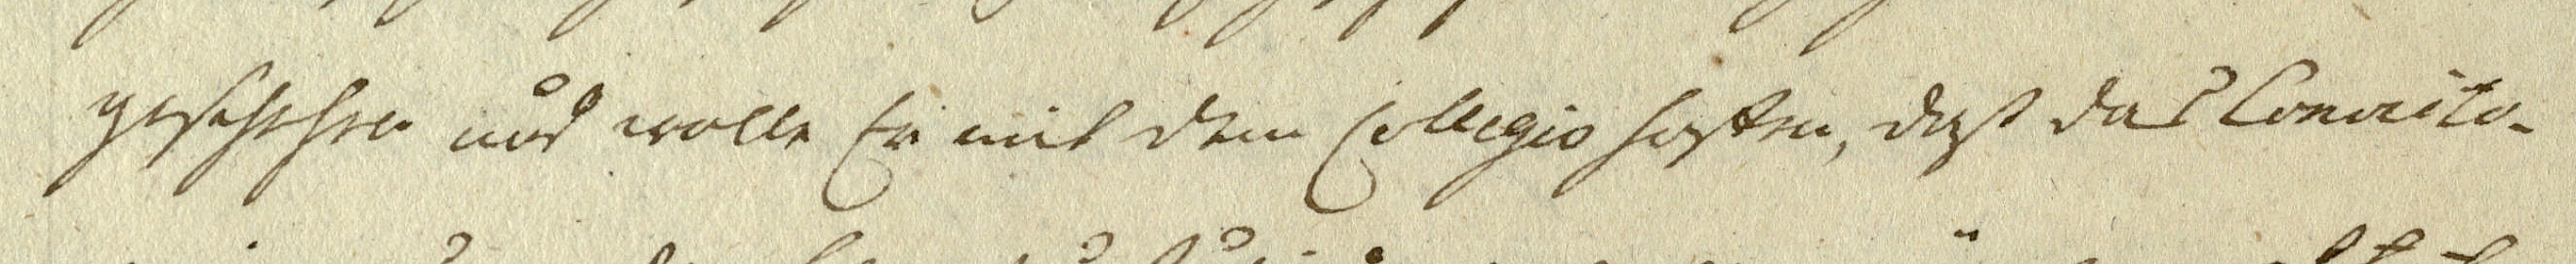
geschehen und wolle Er mit dem Collegio hofen, daß das Convicto¬
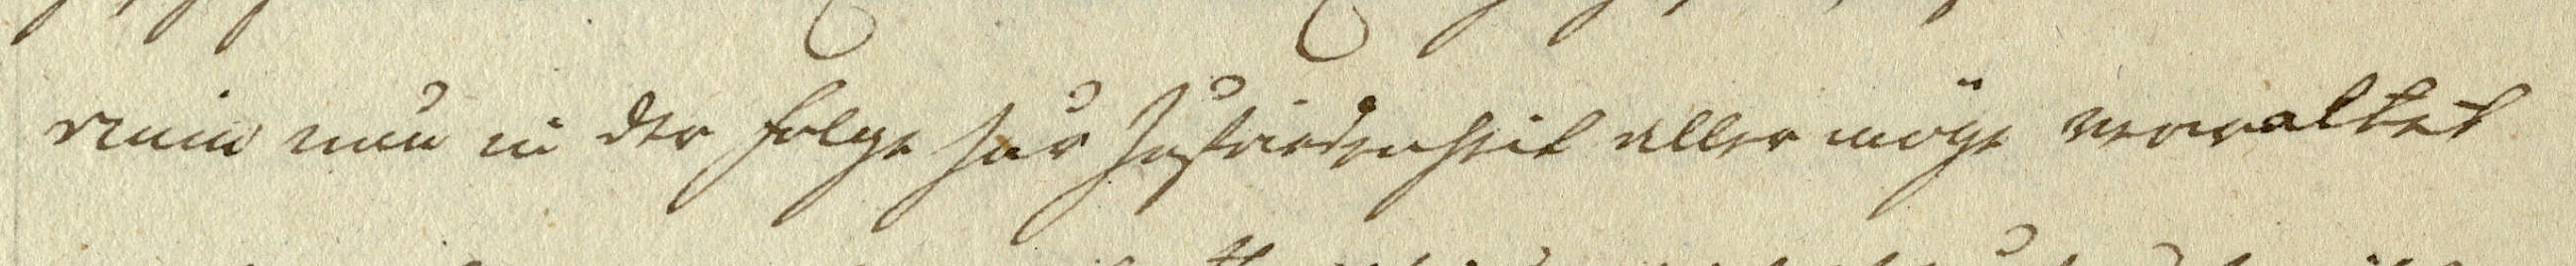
rium nun in der Folge zur Zufriedenheit aller möge verwaltet
